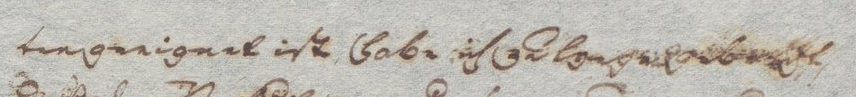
ten geeignet ist, habe ich zu Wege gebracht,
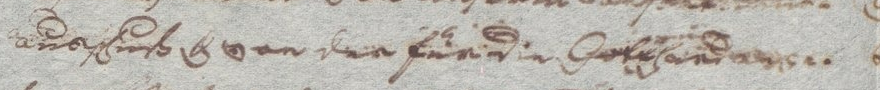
ausschuß & von der für die Gotthardange-
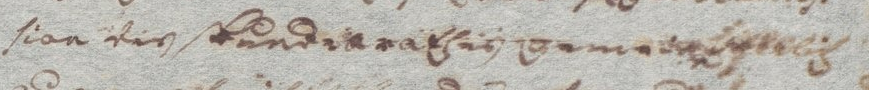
sion des Bundesrathes gemeinschaftlich
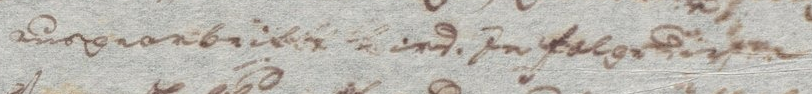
ausgearbeitet wird. In Folge dieser
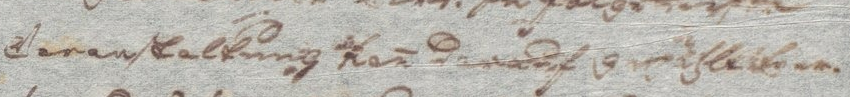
Veranstaltung kann darauf gezählt wer-
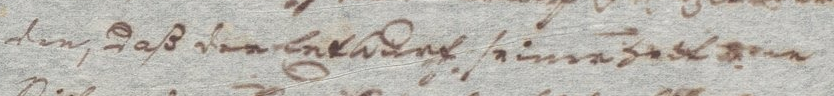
den, daß der Entwurf seiner Zeit von
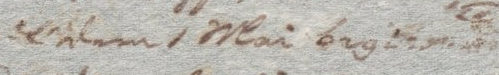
mit dem 1 Mai beginnenden
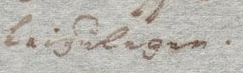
beizulegen.
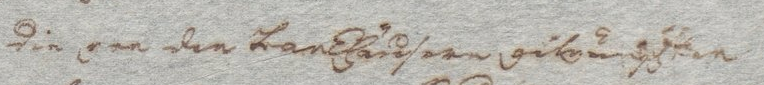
Die von den Bankhäusern gewünschten
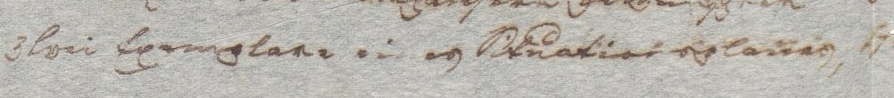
zwei Exemplare eines Situationsplanes,
